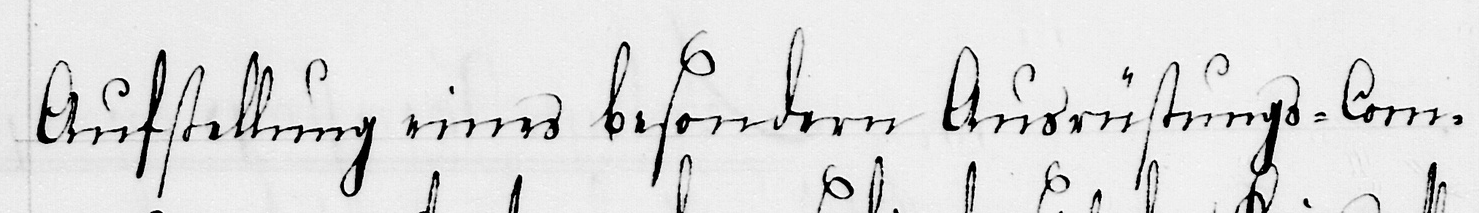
Aufstellung eines besondern Ausrüstungs-Com¬
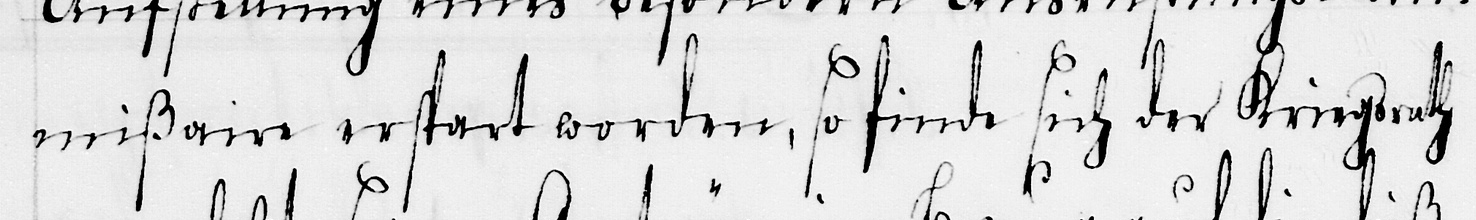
mißaire erspart worden, so finde sich der Kriegsrath
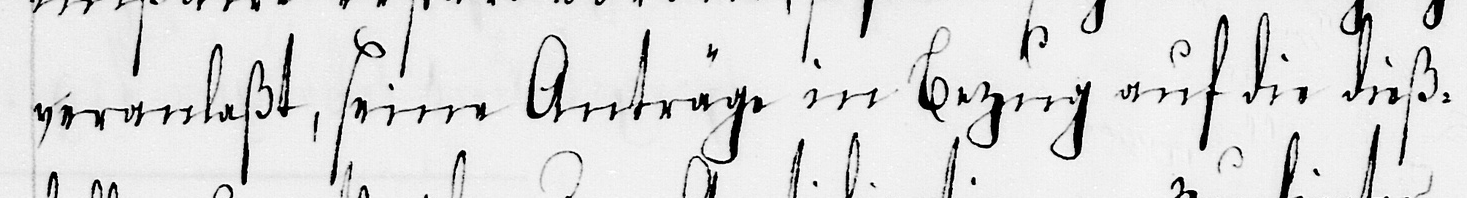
veranlaßt, seine Anträge in Bezug auf die dieß¬
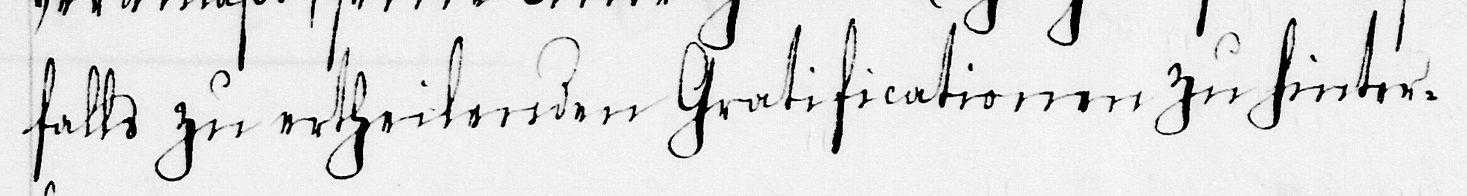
falls zu ertheilenden Gratificationen zu hinter¬
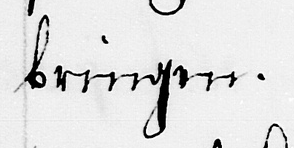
bringen.
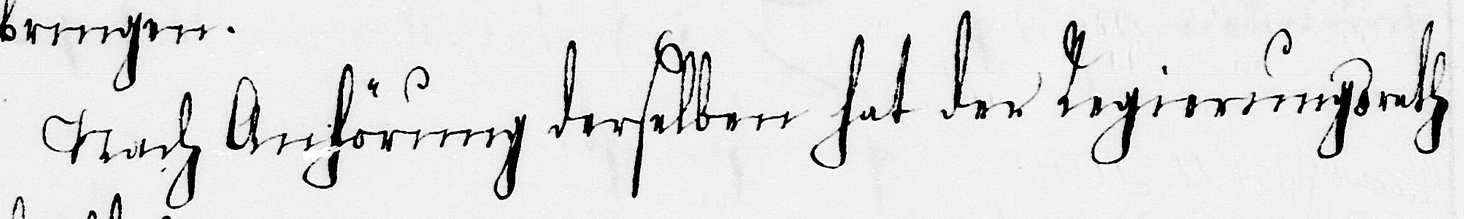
Nach Anhörung derselben hat der Regierungsrath
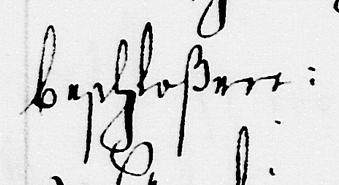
beschloßen:
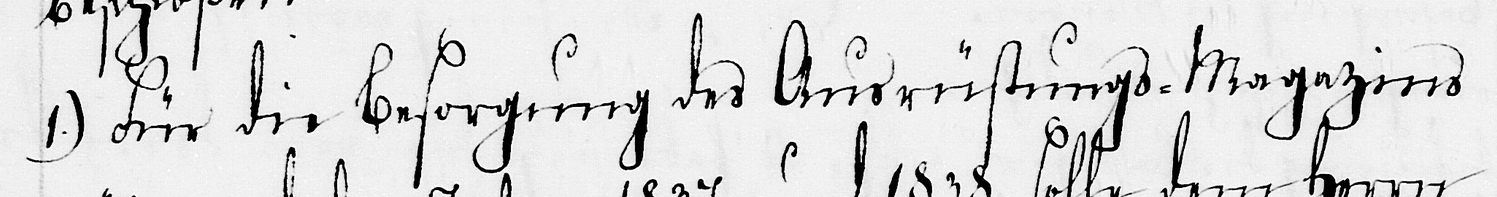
1.) Für die Besorgung des Ausrüstungs-Magazins
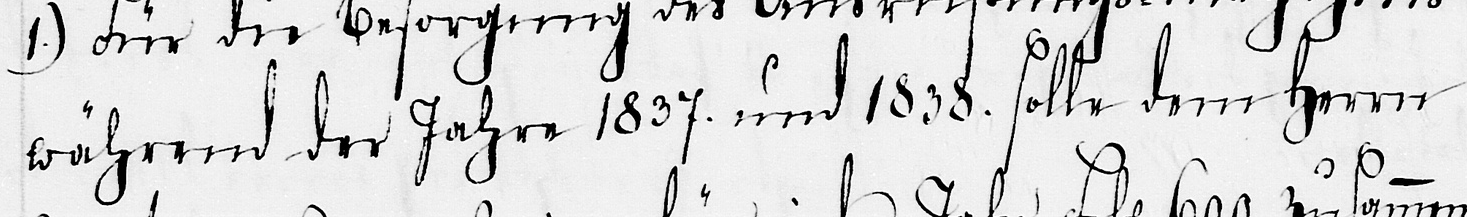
während der Jahre 1837. und 1838. solle dem Herrn
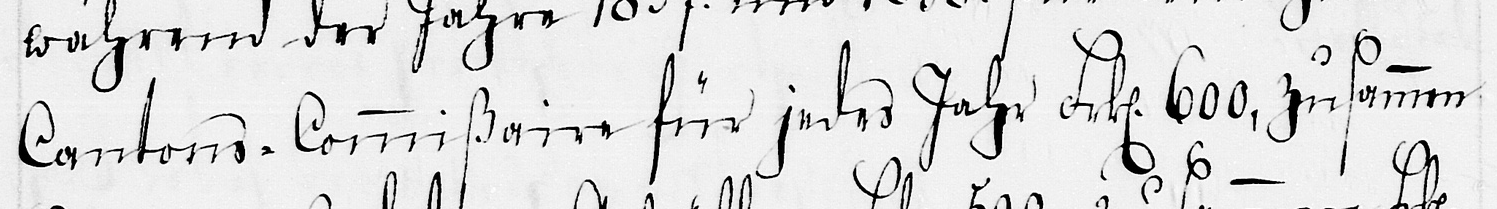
Cantons-Commißaire für jedes Jahr Frk[en]. 600, zusammen
